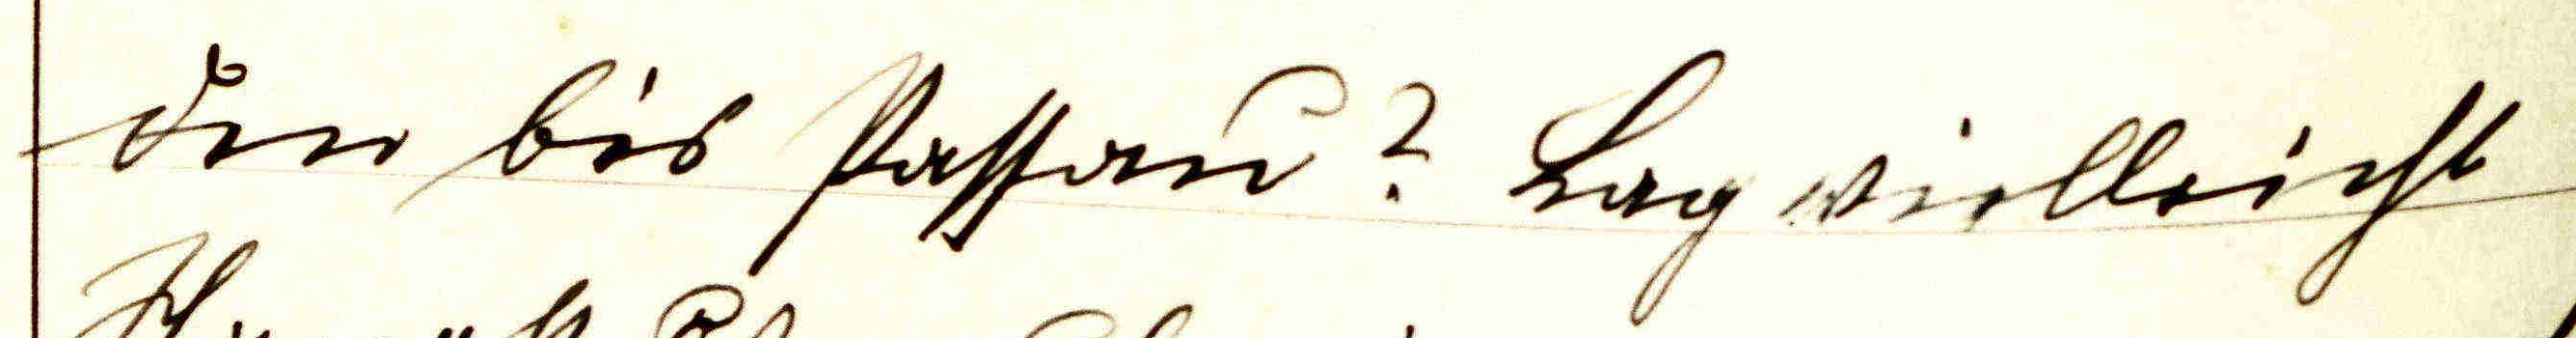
den den bis Passau? Lag vielleicht
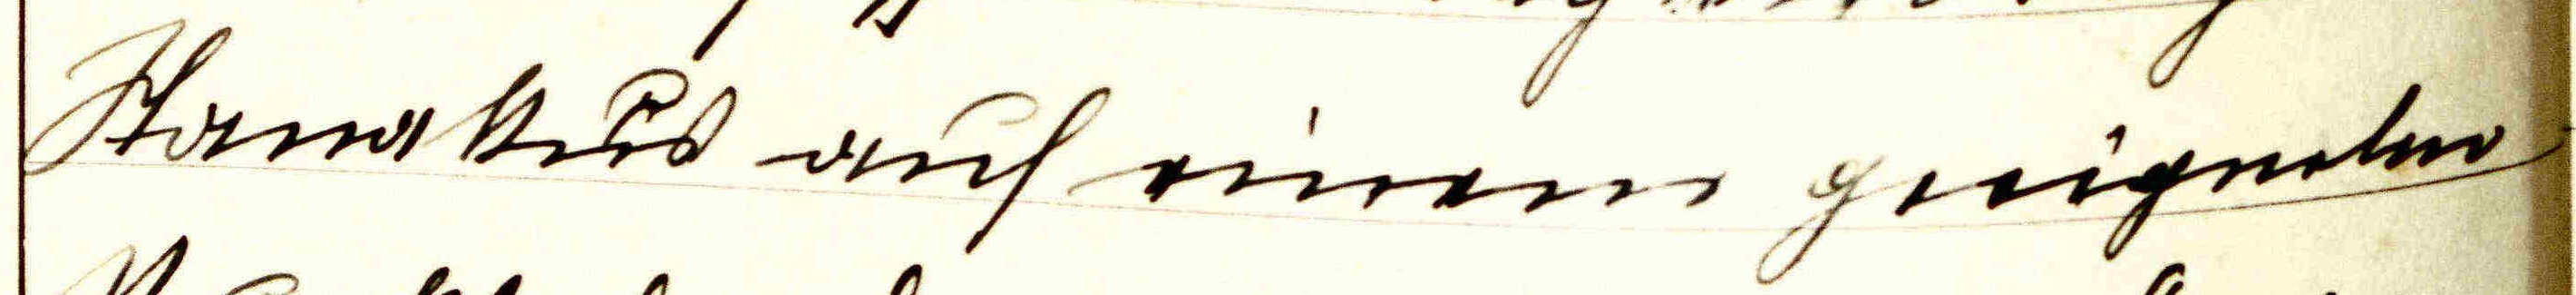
Stanakus auf einem geeigneten
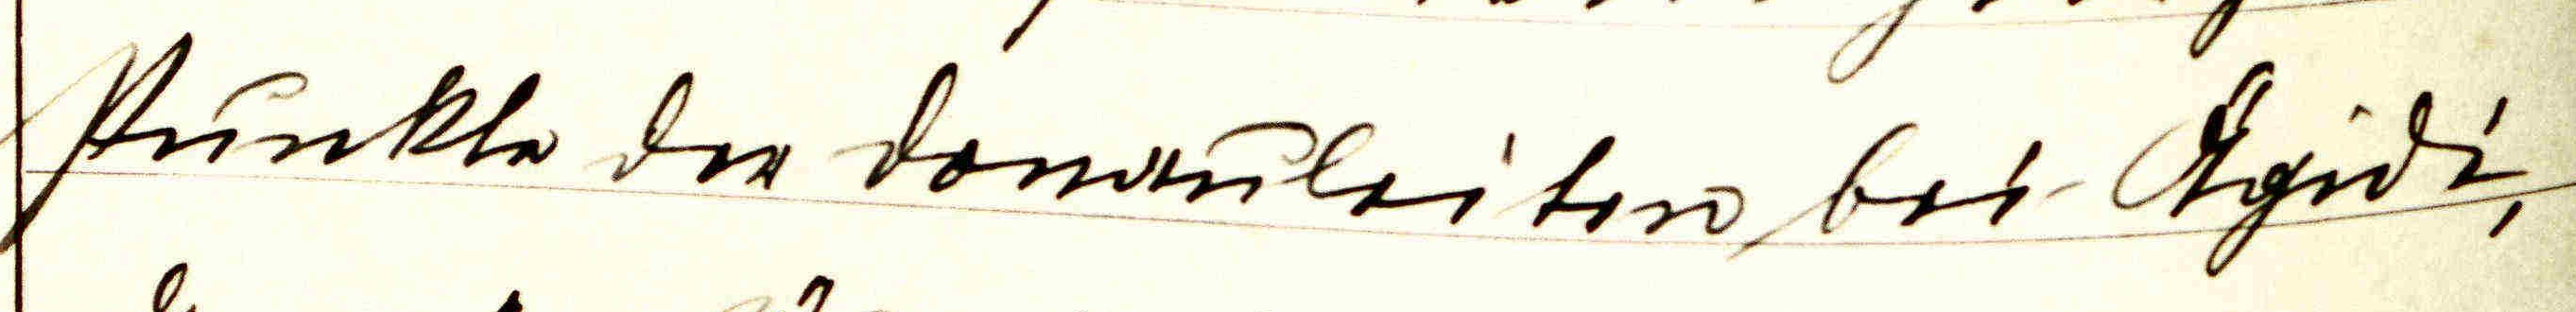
Punkte der Donauleiten bei Ägidi,
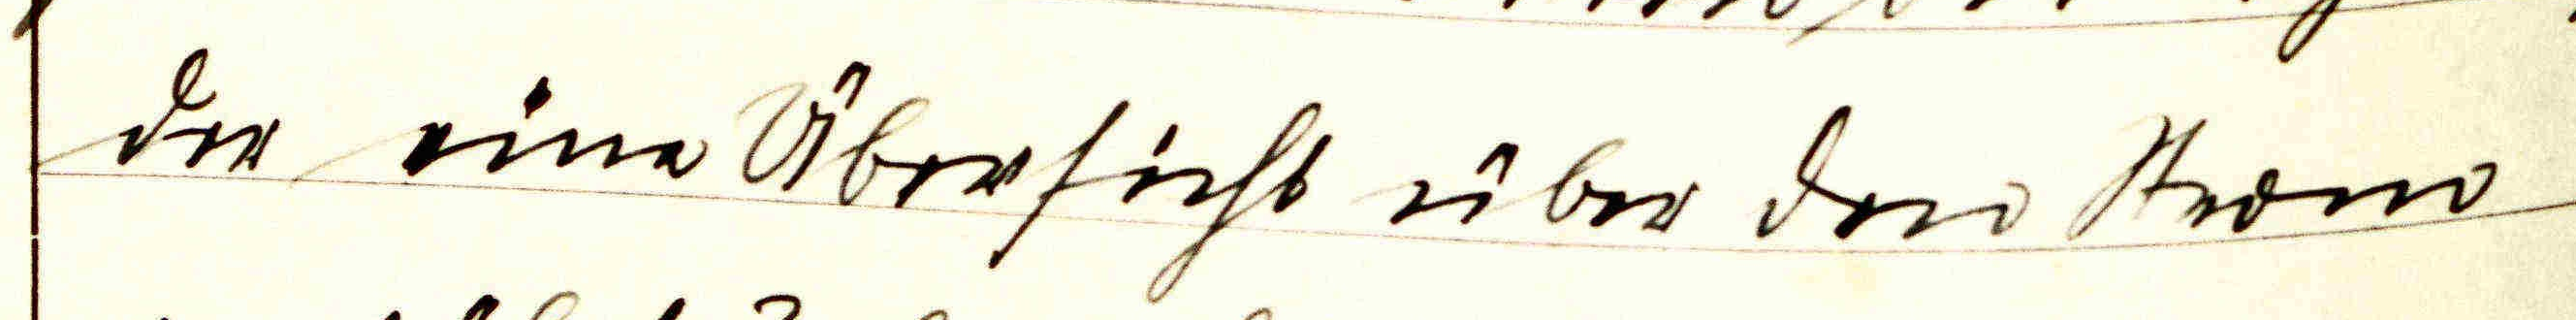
der eine Übersicht über den Strom
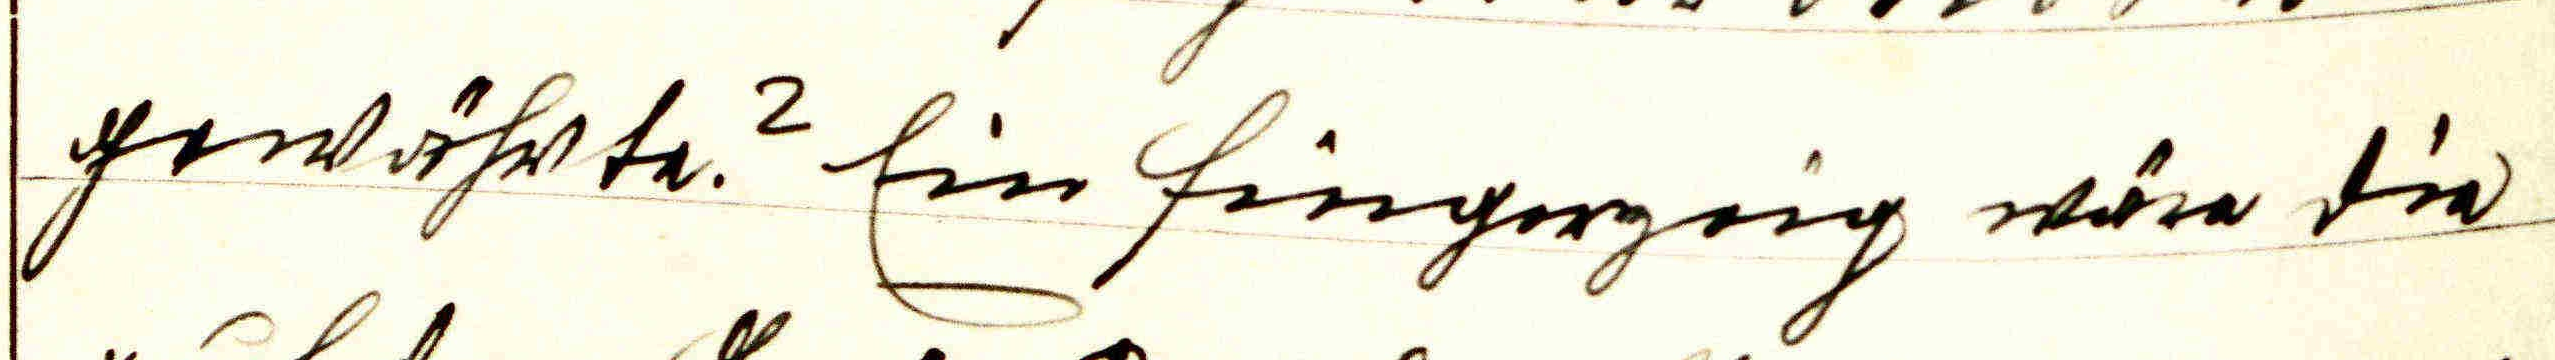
gewährte? Ein Fingerzweig wäre die
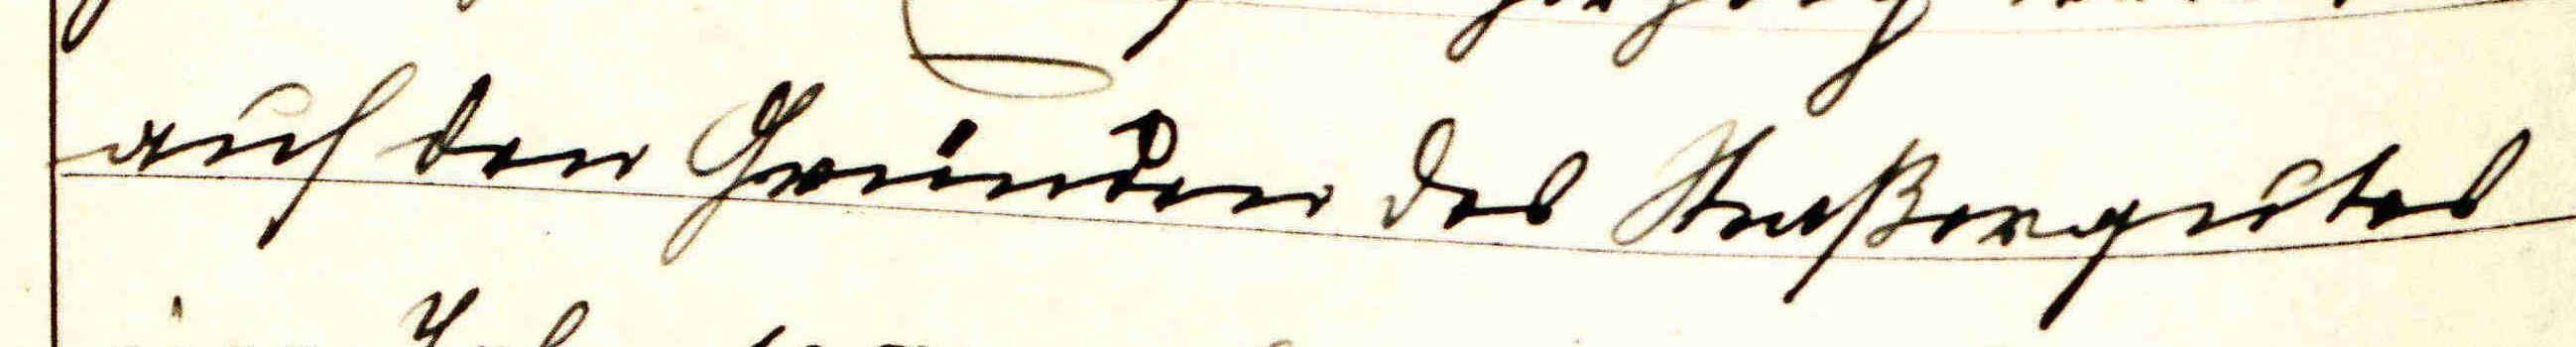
auf den Gründen des Straßergutes
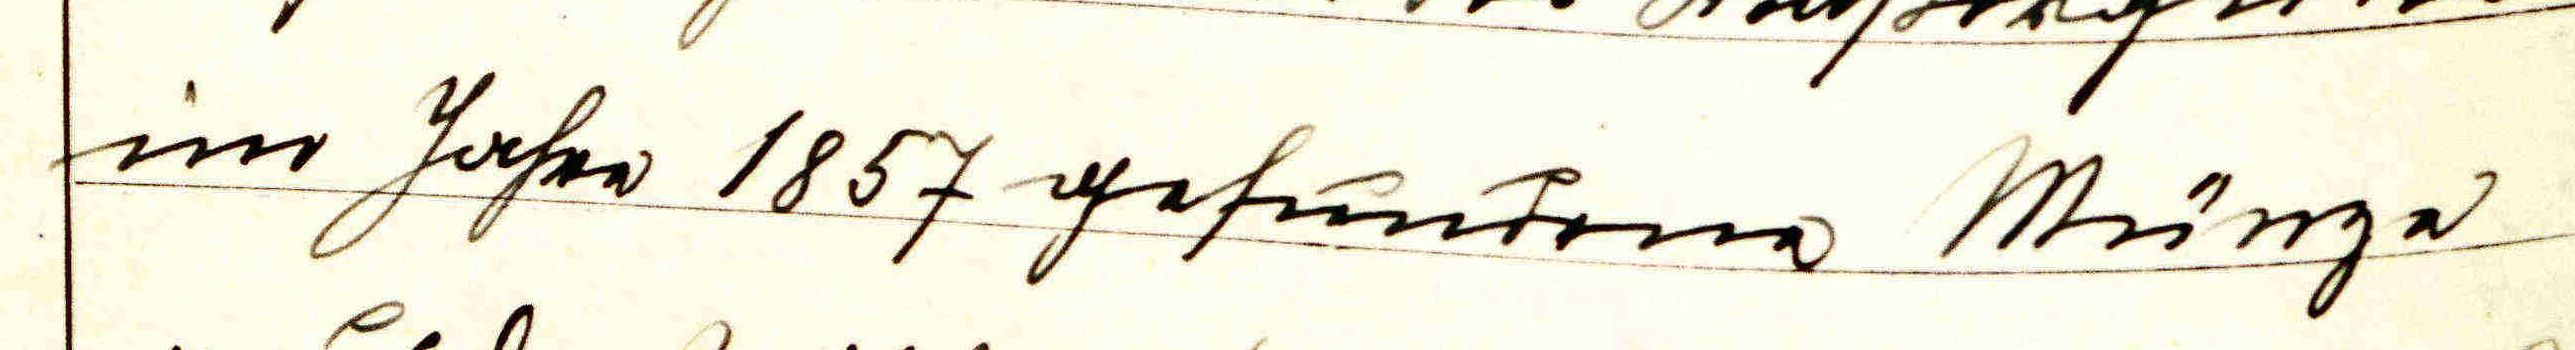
im Jahre 1857 gefundene Münze
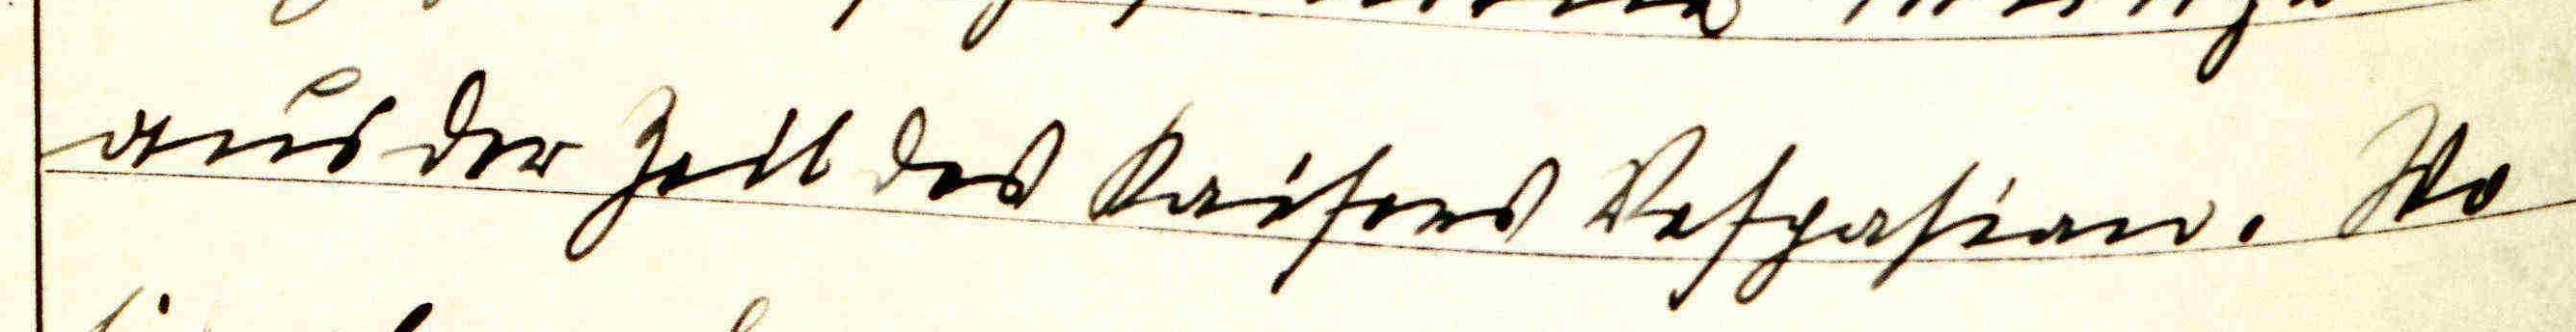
aus der Zeit des Kaisers Vespasian. Wo
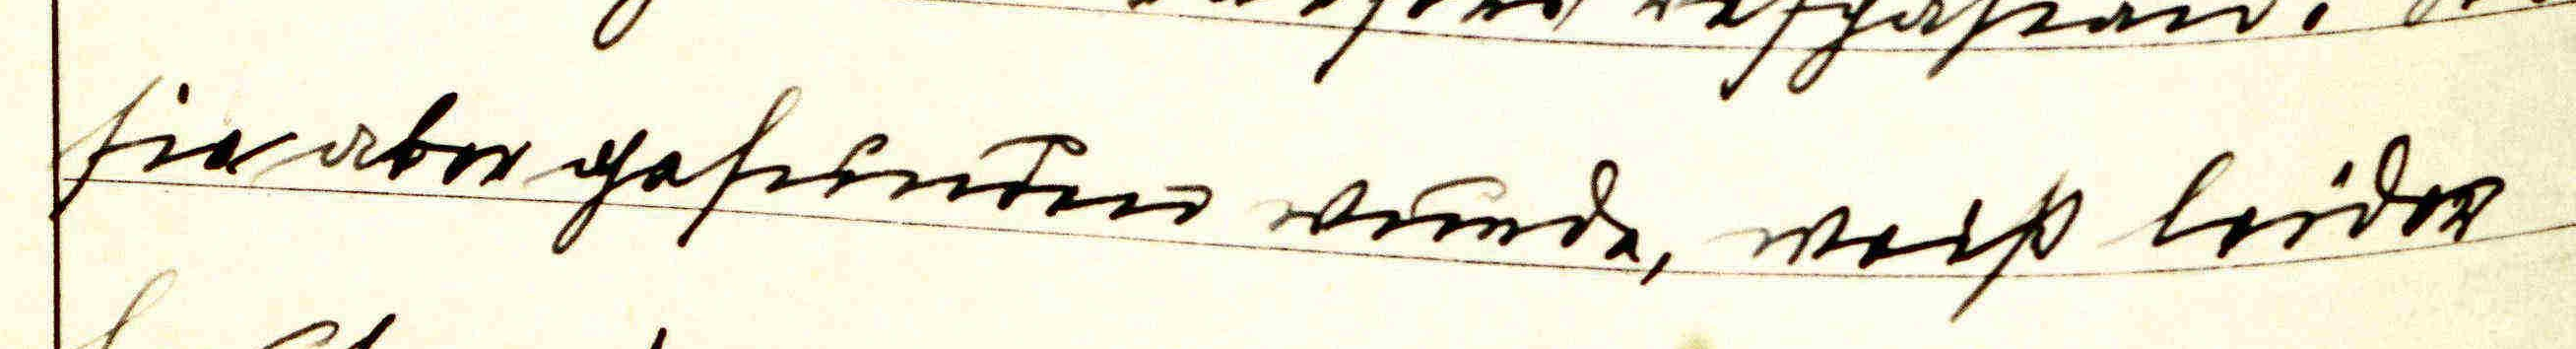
sie aber gefunden wurde, weiß leider
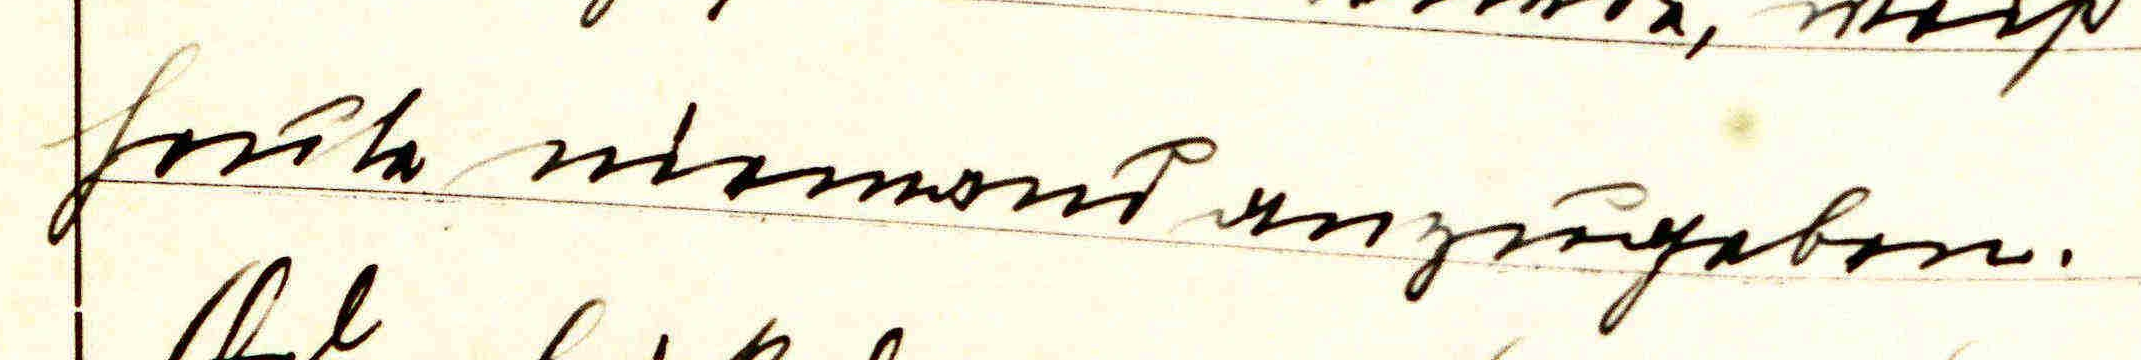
heute niemand anzugeben.
